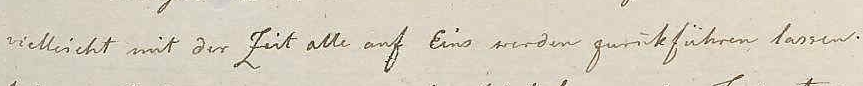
vielleicht mit der Zeit alle auf Eins werden zurükführen lassen.
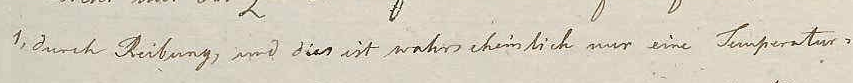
1, durch Reibung, und dies ist wahrscheinlich nur eine Temperatur-
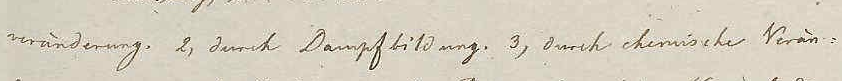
veränderung. 2, durch Dampfbildung. 3, durch chemische Verän-
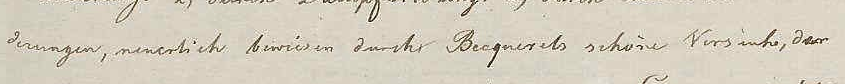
derungen, neuerlich bewiesen durch Becquerels schöne Versuche, der
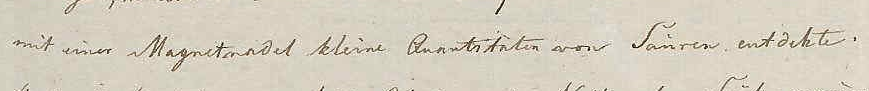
mit einer Magnetnadel kleine Quantitäten von Säuren entdekte.
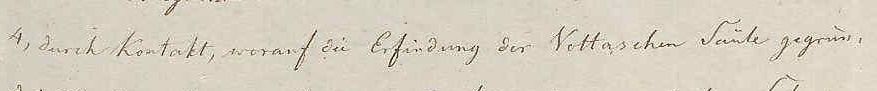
4, durch Kontakt, worauf die Erfindung der Voltaschen Säule gegrün-
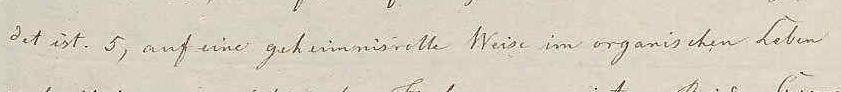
det ist. 5, auf eine geheimnisvolle Weise im organischen Leben
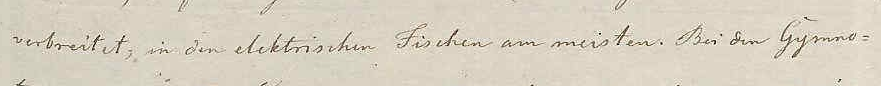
verbreitet, in den elektrischen Fischen am meisten. Bei den Gymno-
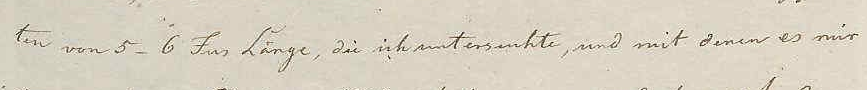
ten von 5–6 Fus Länge, die ich untersuchte, und mit denen es mir
